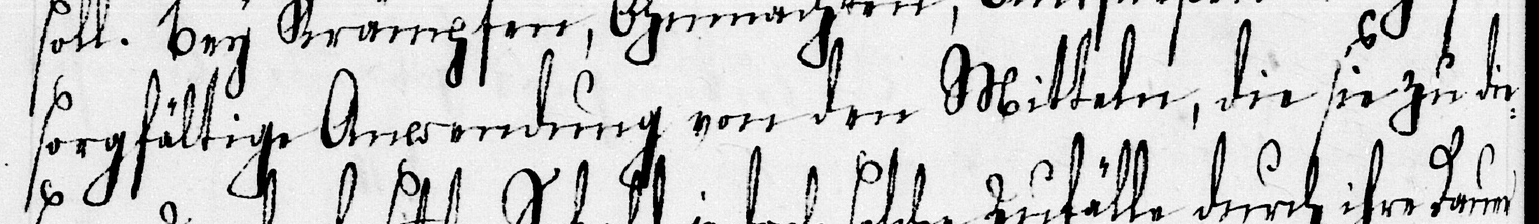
sorgfältige Anwendung von den Mitteln, die sie zu di¬
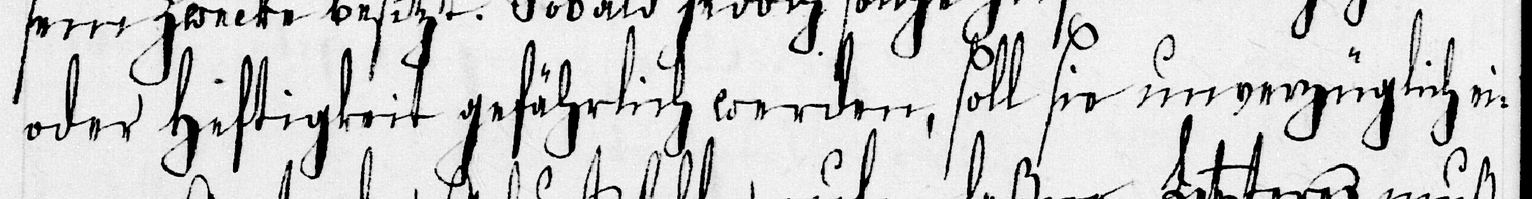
oder Heftigkeit gefährlich werden, soll sie unverzüglich ei¬
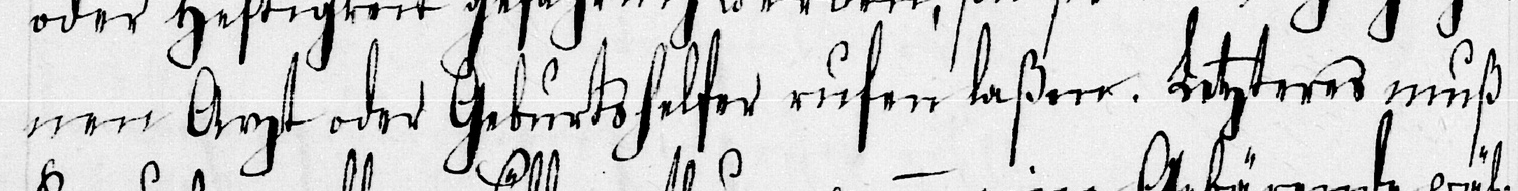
nen Arzt oder Geburtshelfer rufen laßen. Letzteres muß
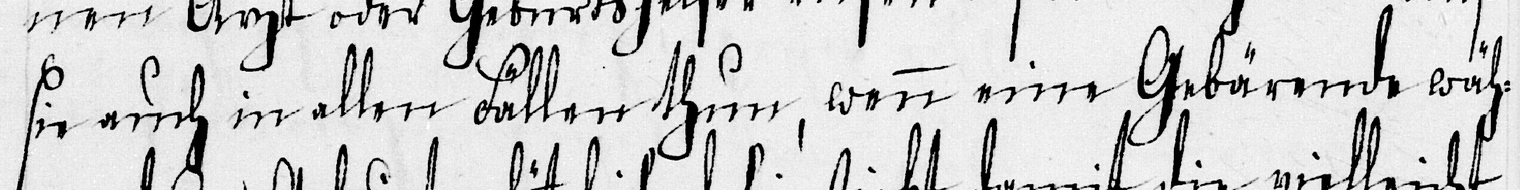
sie auch in allen Fällen thun, wenn eine Gebärende wäh¬
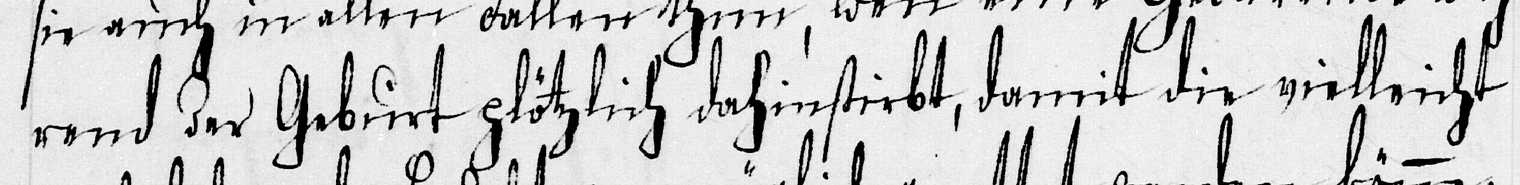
rend der Geburt plötzlich dahinstirbt, damit die vielleicht
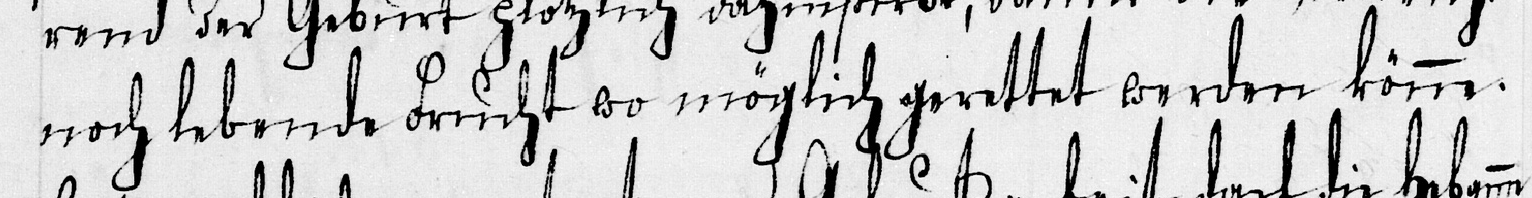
noch lebende Frucht wo möglich gerettet werden könne.
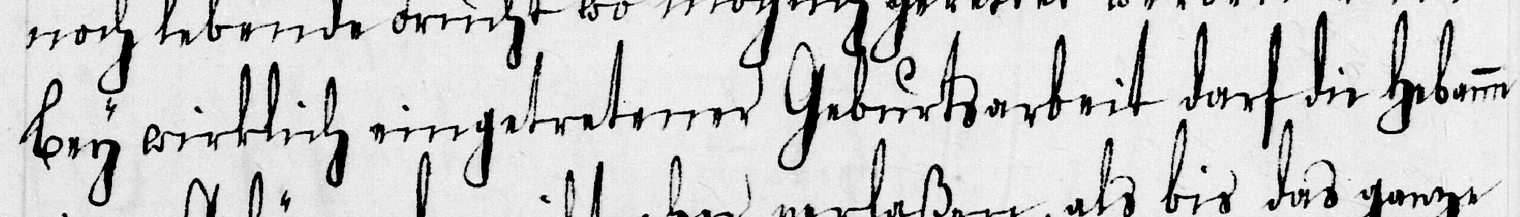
Bey wirklich eingetretener Geburtsarbeit darf die Hebam¬
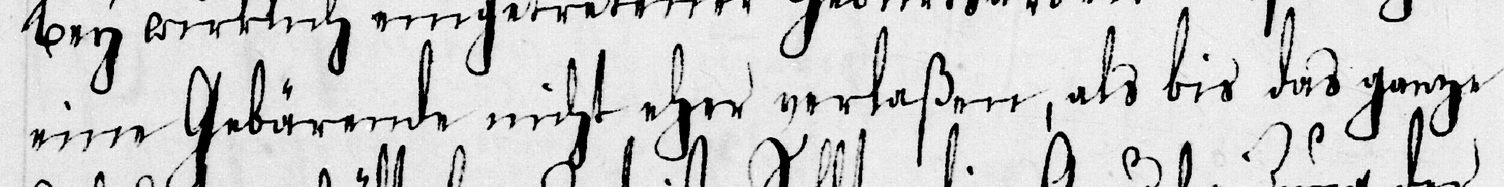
eine Gebärende nicht eher verlaßen, als bis das ganze
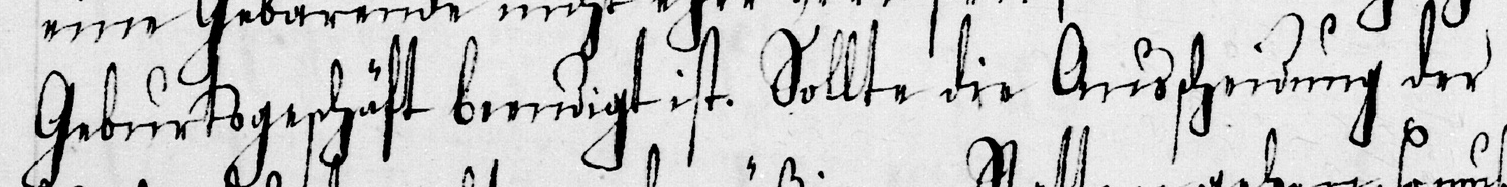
Geburtsgeschäft beendet ist. Sollte die Ausscheidung der
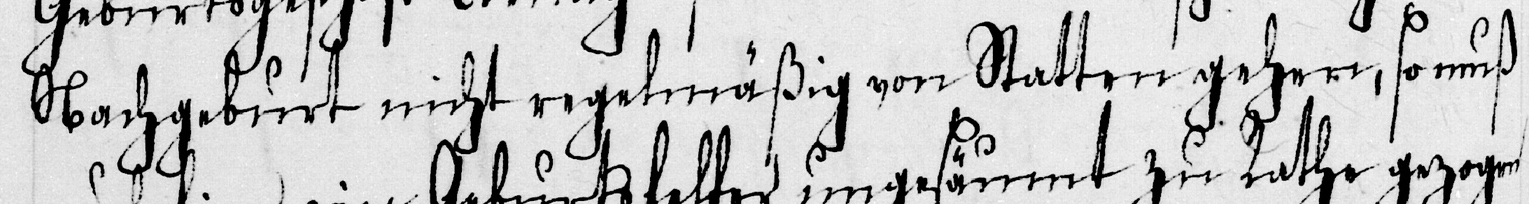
Nachgeburt nicht regelmäßig von Statten gehen, so muß
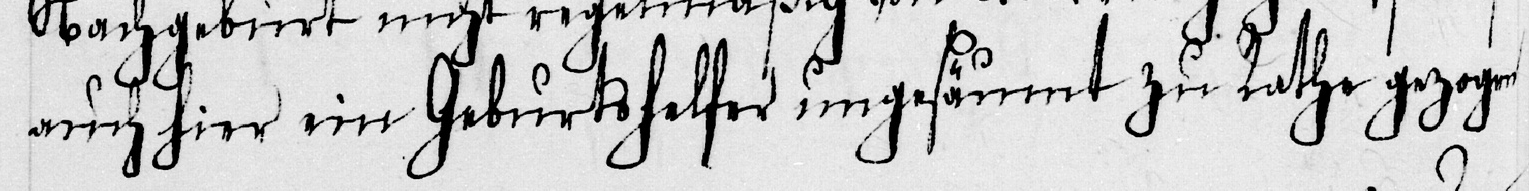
auch hier ein Geburtshelfer ungesäumt zu Rathe gezog¬
